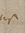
Diese
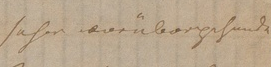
sehr vorübergehende
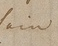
sein –
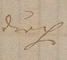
durch die
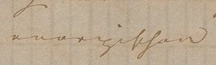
energischen
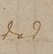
des
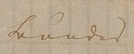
Bundes –
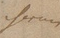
ihren
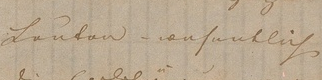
Leuten – wesentlich
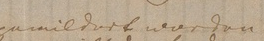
gemildert werden. –
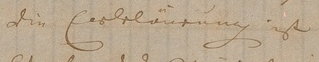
Die Erklärung ist daher nicht
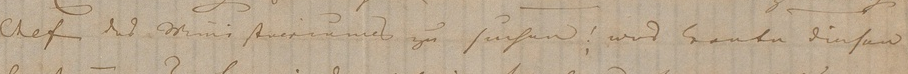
Chef des Ministeriums zu suchen! was konte diesen
